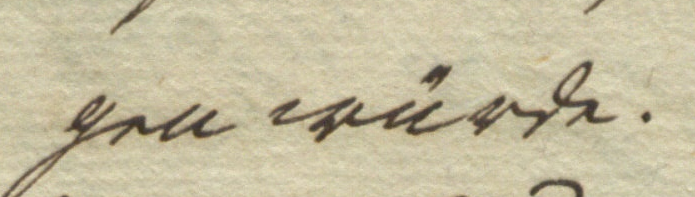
gen würde.
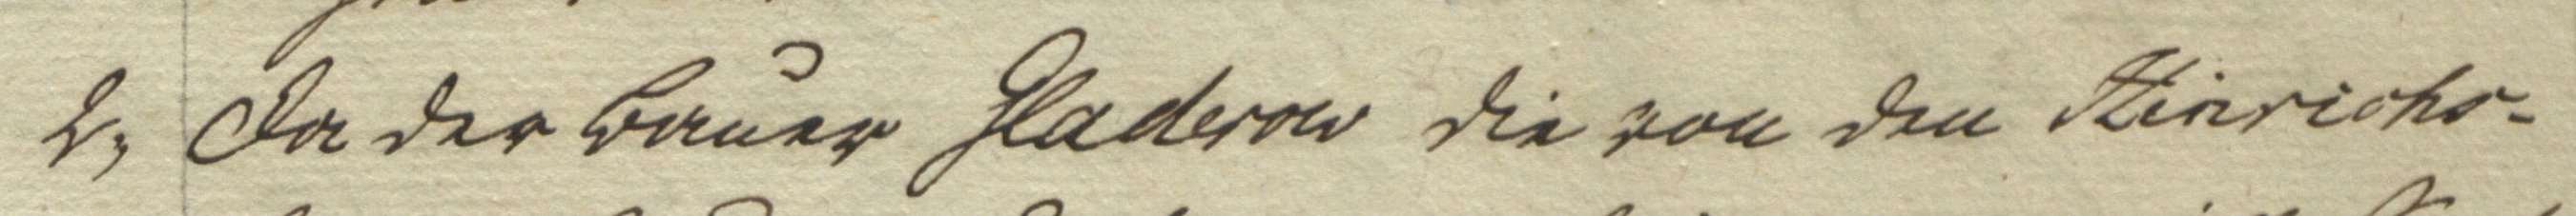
2. Da der Bauer Gladerow die von den Hinrichs¬
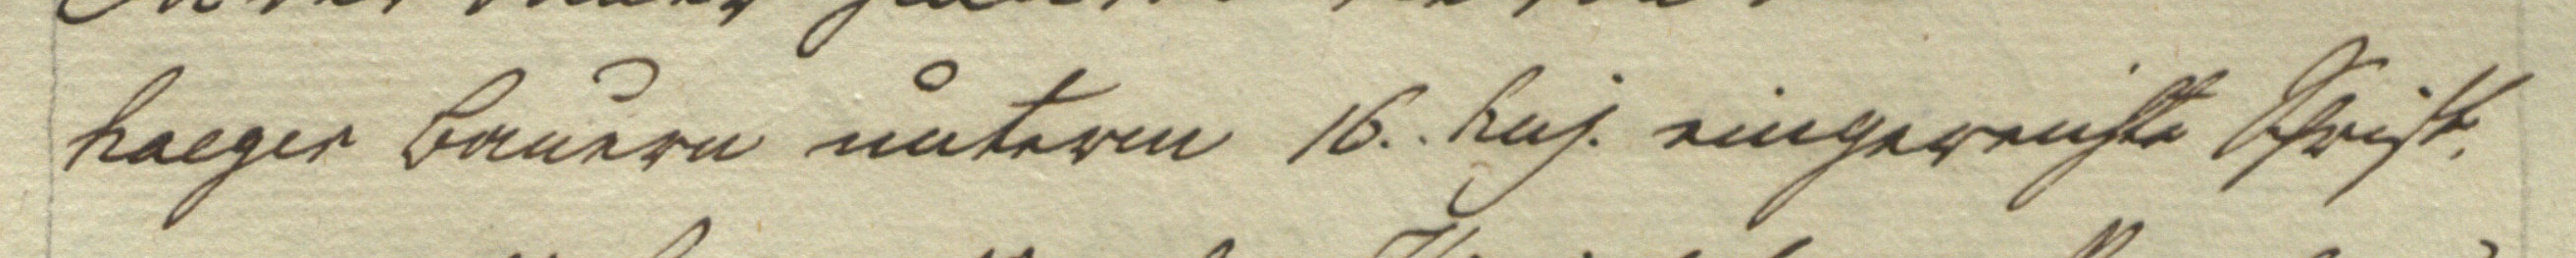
haeger Bauern unterm 16. huj. eingereichte Schrift,
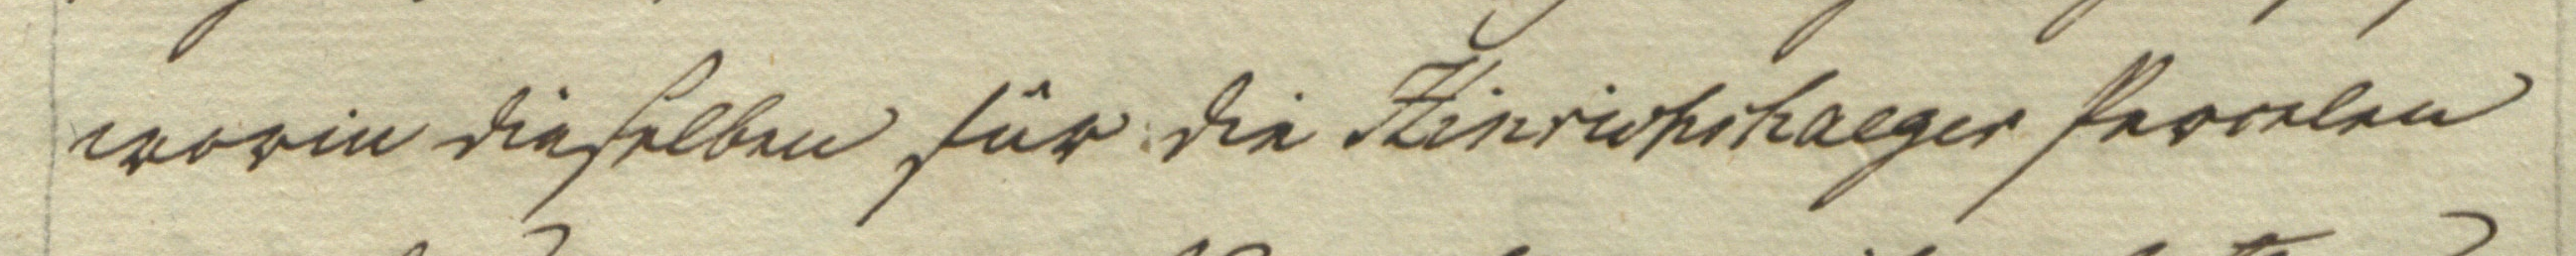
worin dieselben für die Hinrichshaeger Percelen
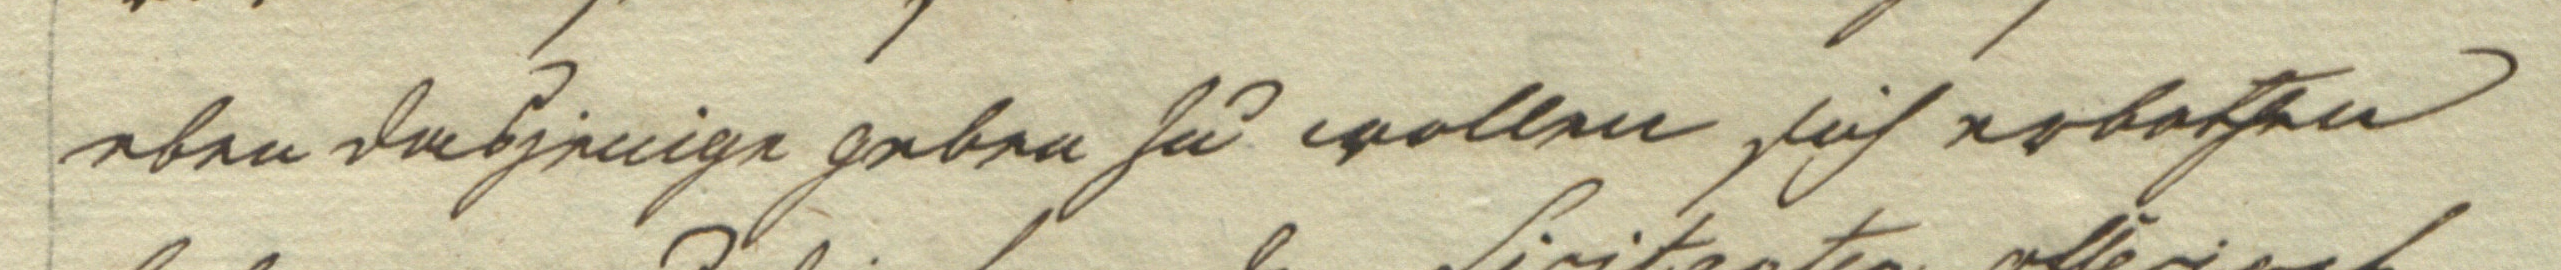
eben dasjenige geben zu wollen sich erbothen
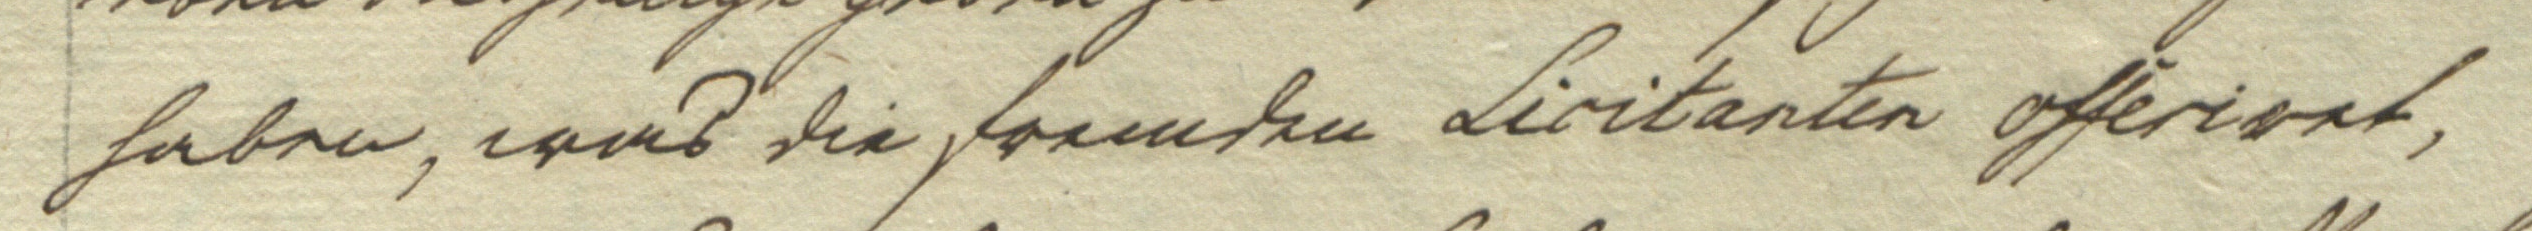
haben, was die fremden Licitanten offeriret,
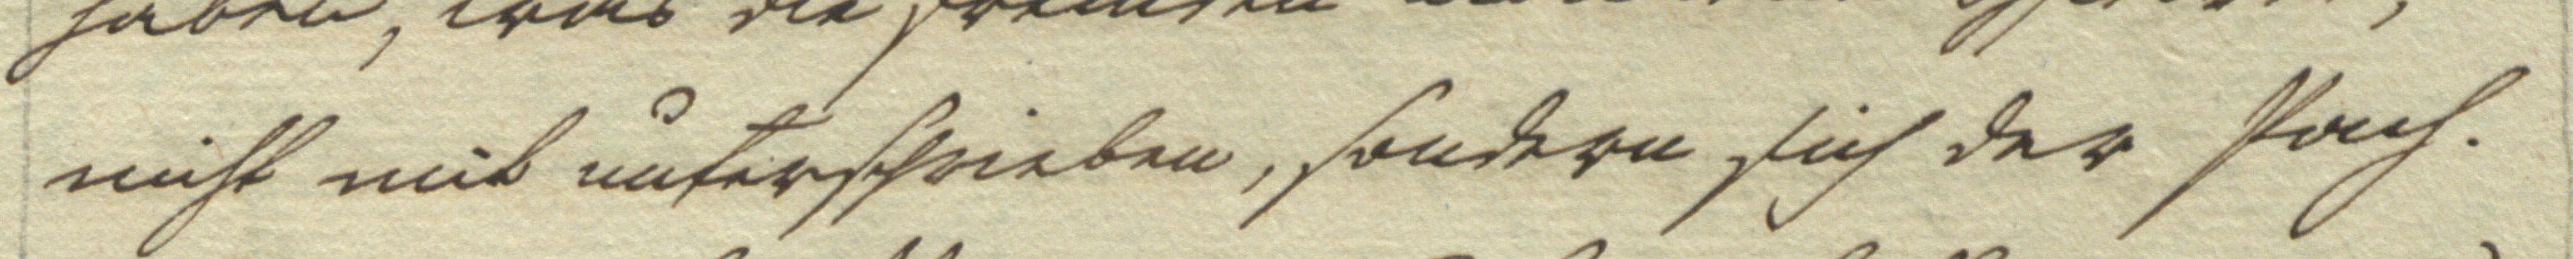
nicht mit unterschrieben, sondern sich der Pach¬
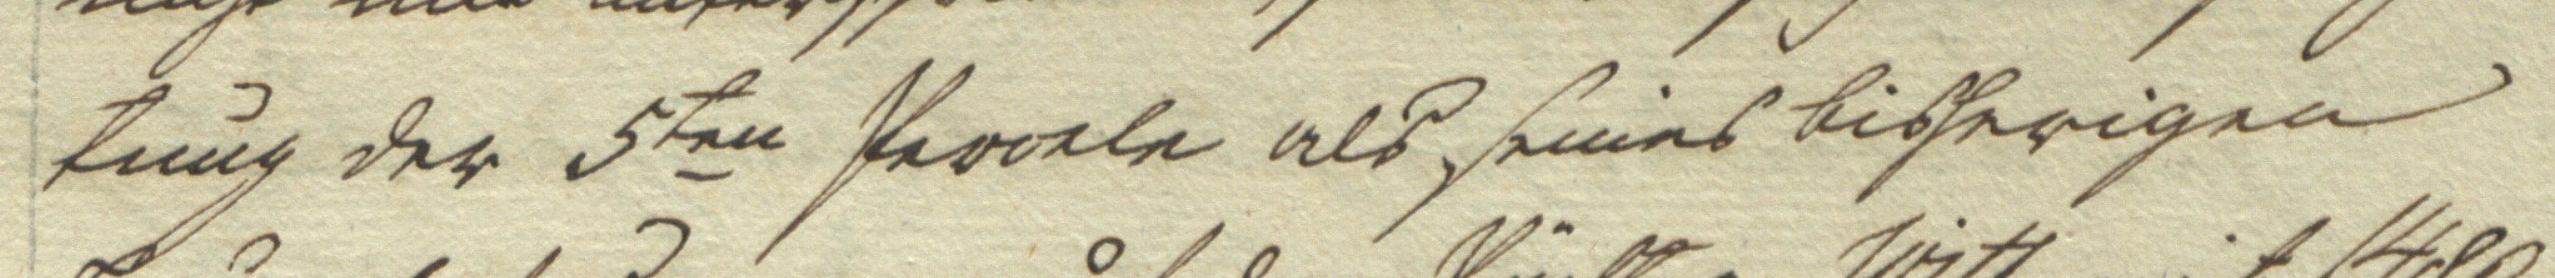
tung der 5 ten Percele als seines bisherigen
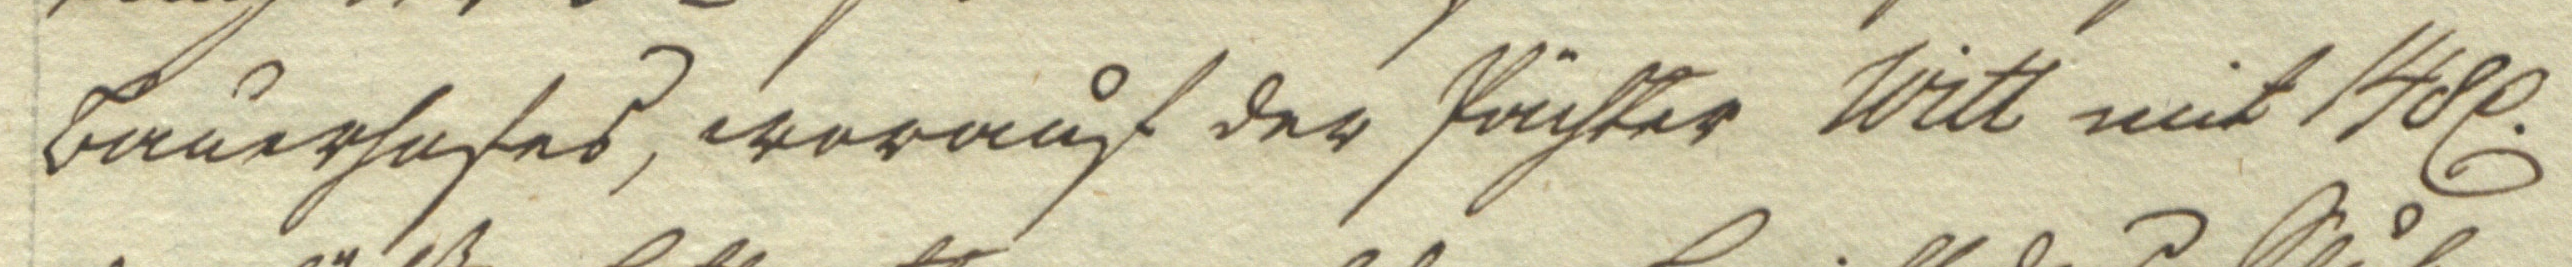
Bauerhofes, worauf der Pächter Witt mit 148 l.
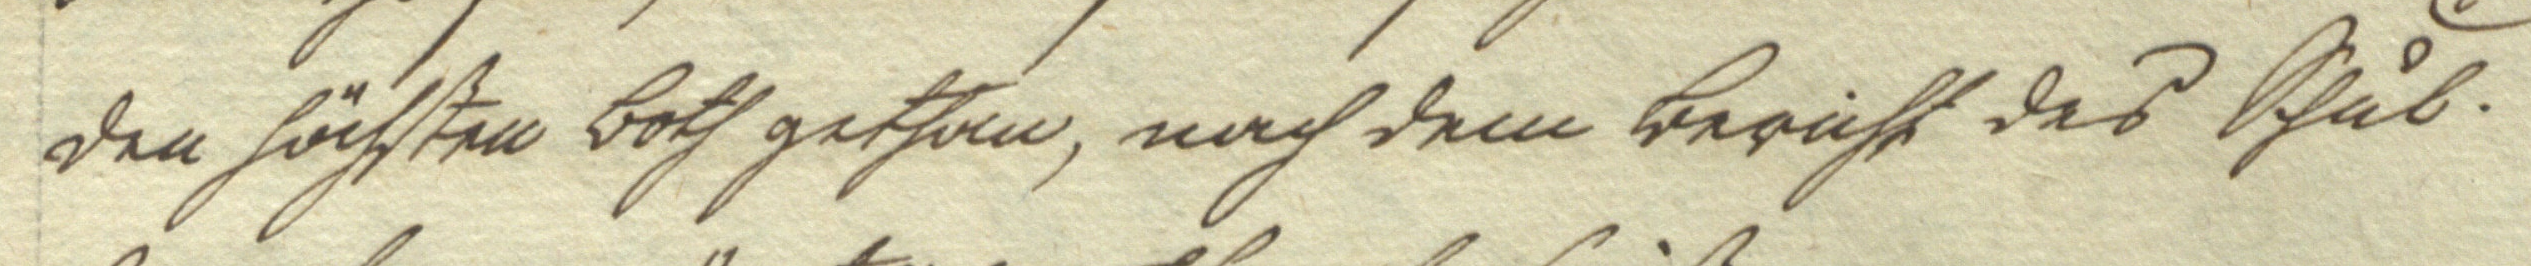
den höchsten Both gethan, nach dem Bericht des Schul¬
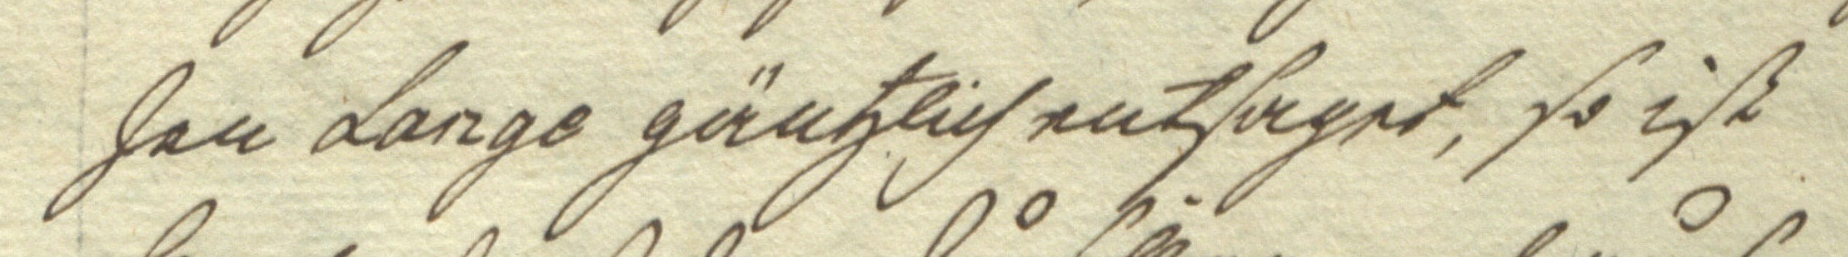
zen Lange gäntzlich entsaget, so ist
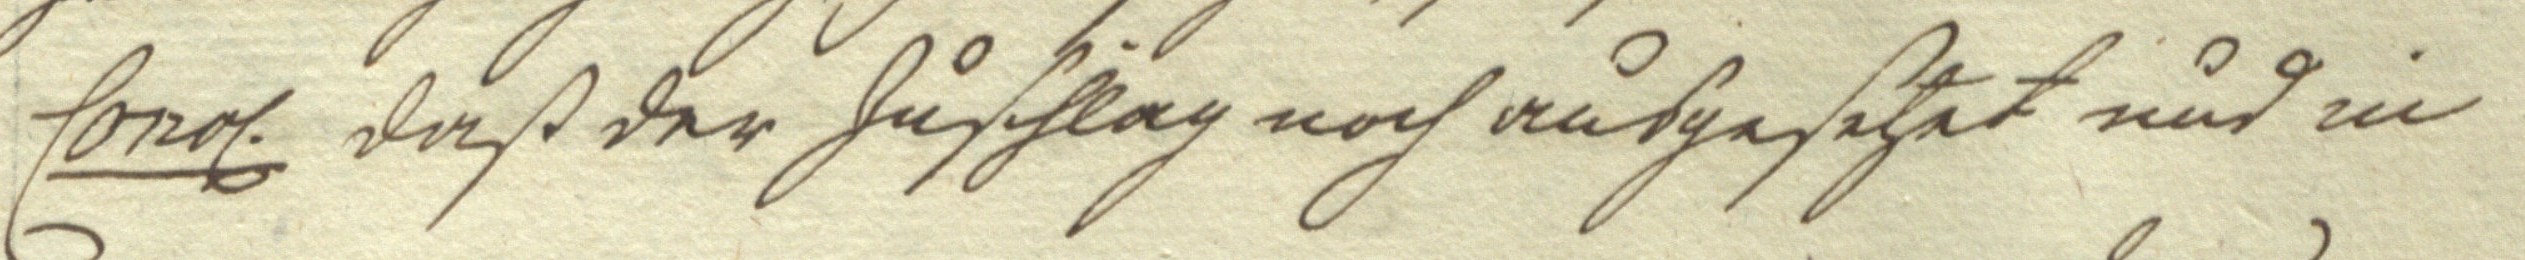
Concl. daß der Zuschlag noch ausgesetzet und in
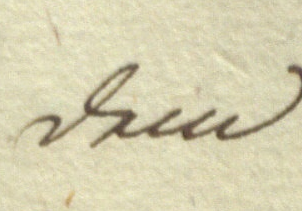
dem
